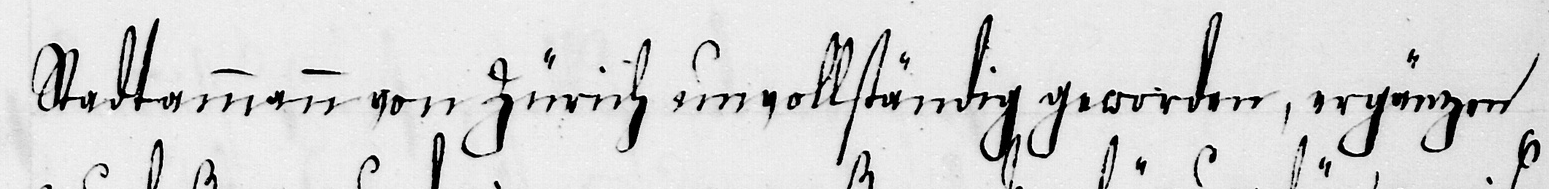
Stadtammann von Zürich unvollständig geworden, ergänzen
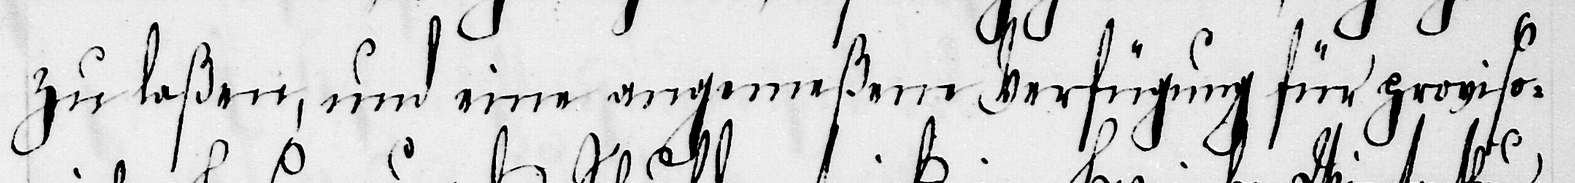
zu laßen, und eine angemeßene Verfügung für proviso¬
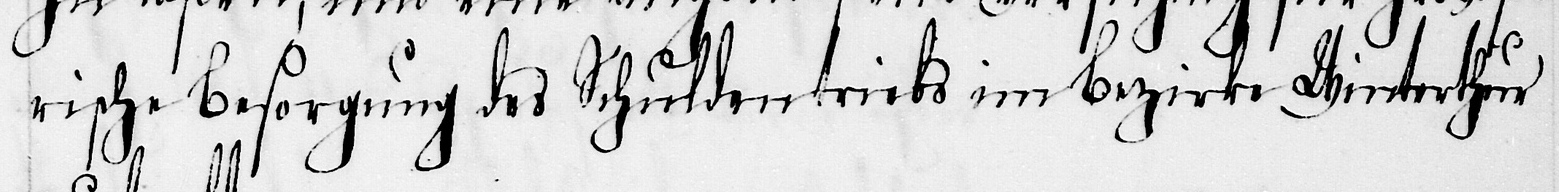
rische Besorgung des Schuldentriebs im Bezirke Winterthur
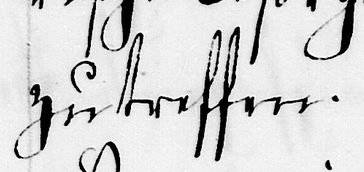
zu treffen.
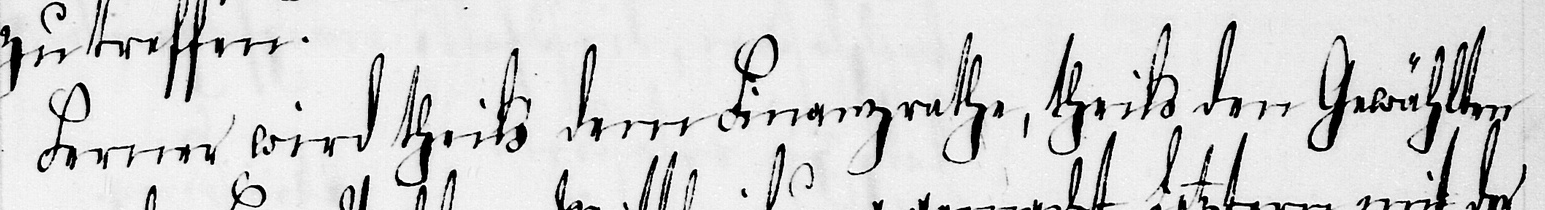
Ferner wird theils dem Finanzrathe, theils den Gewählten
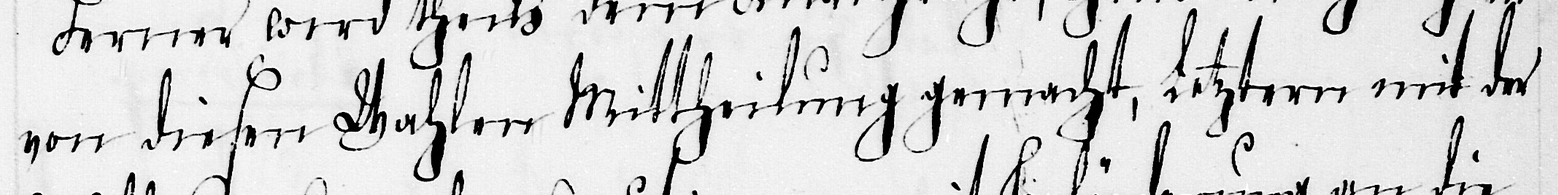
von diesen Wahlen Mittheilung gemacht, Letztern mit der
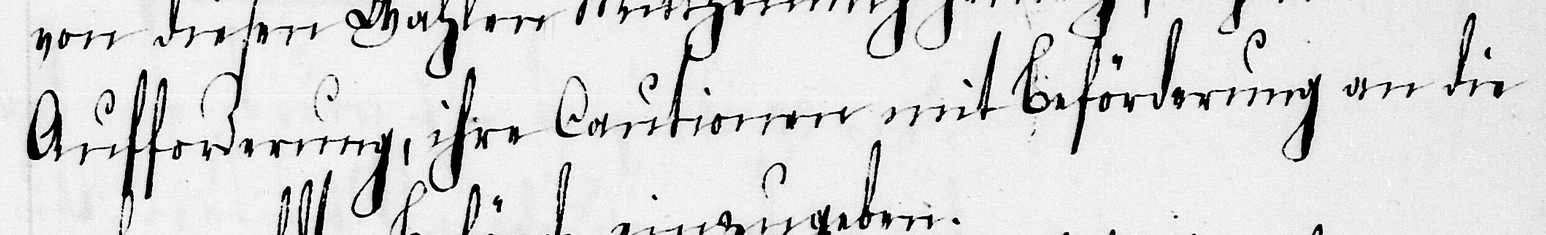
Aufforderung, ihre Cautionen mit Beförderung an die
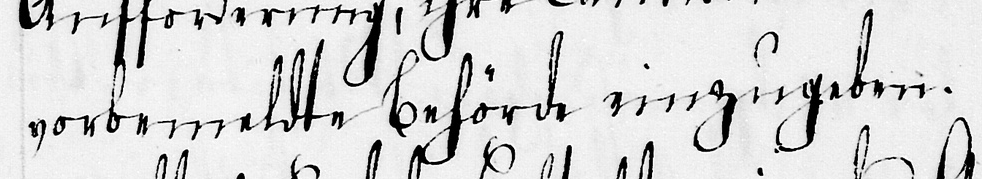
vorbemeldte Behörde einzugeben.
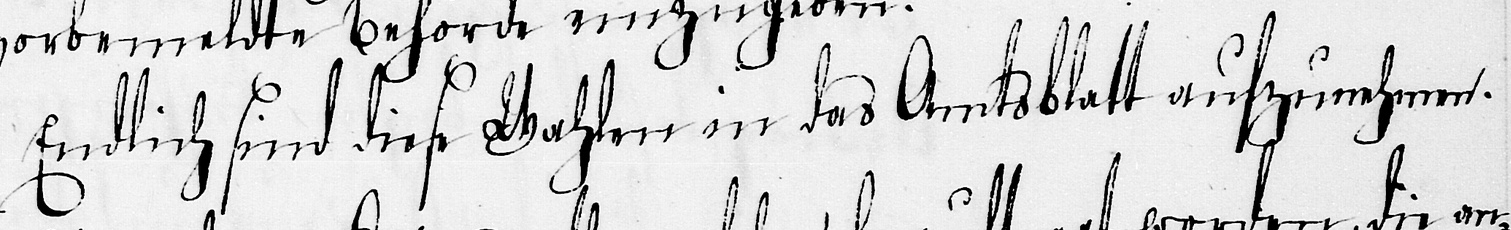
Endlich sind diese Wahlen in das Amtsblatt aufzunehmen.
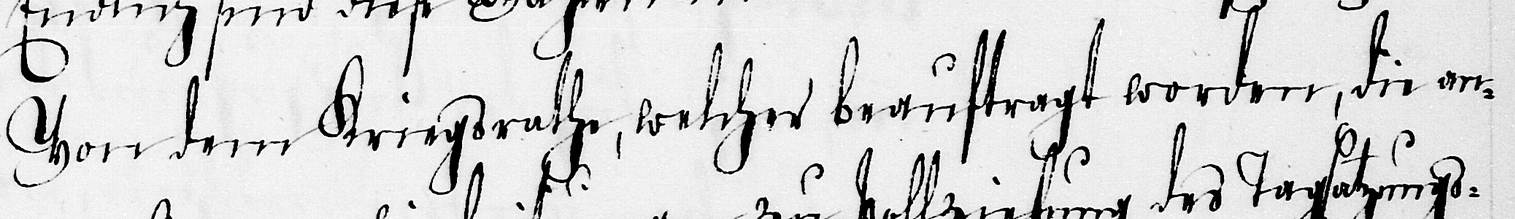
Von dem Kriegsrathe, welcher beauftragt worden, die an¬
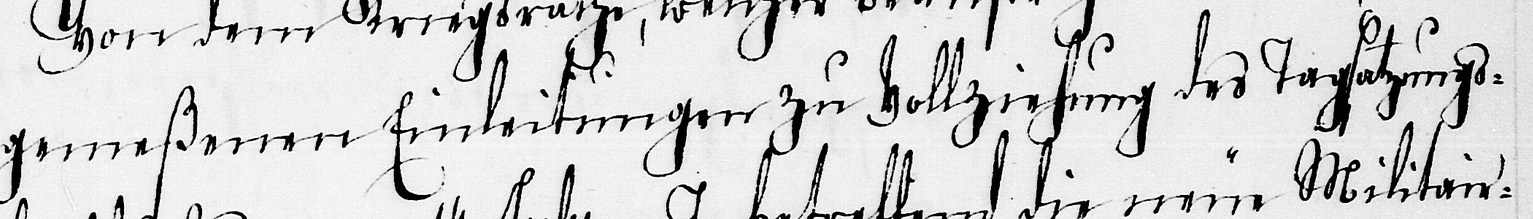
gemeßenen Einleitungen zu Vollziehung des Tagsatzungs¬
